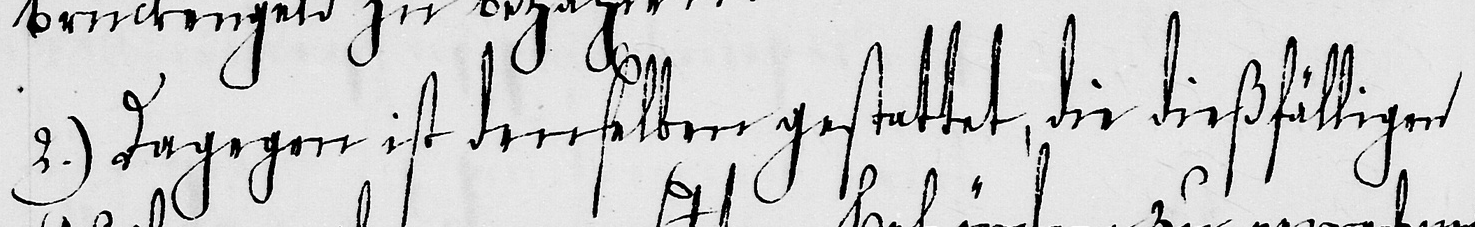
2.) Dagegen ist denselben gestattet, die dießfälligen
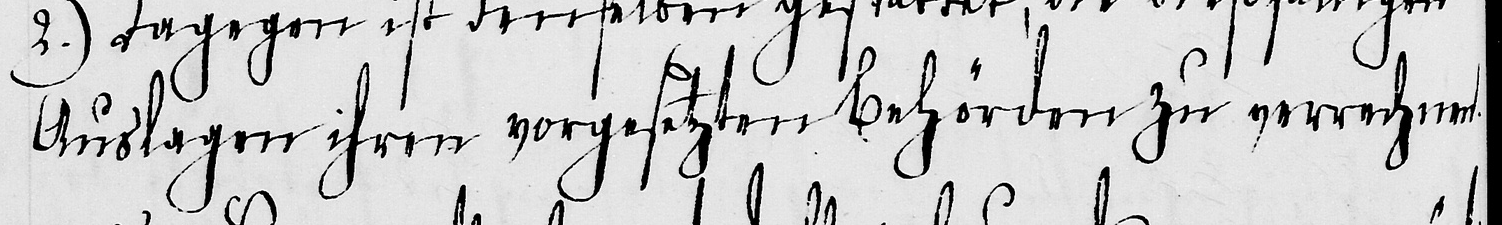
Auslagen ihren vorgesetzten Behörden zu verrechnen.
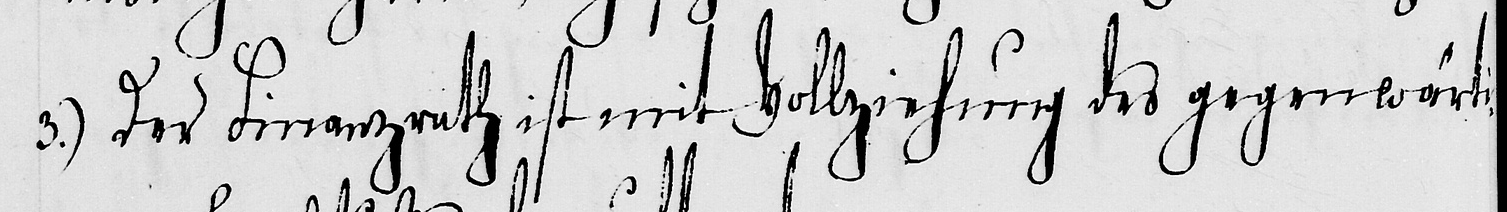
3.) Der Finanzrath ist mit Vollziehung des gegenwärt¬
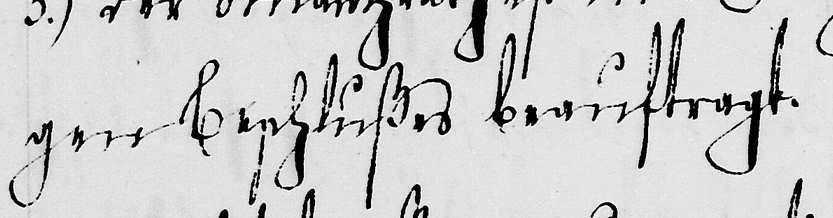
igen Beschlußes beauftragt.
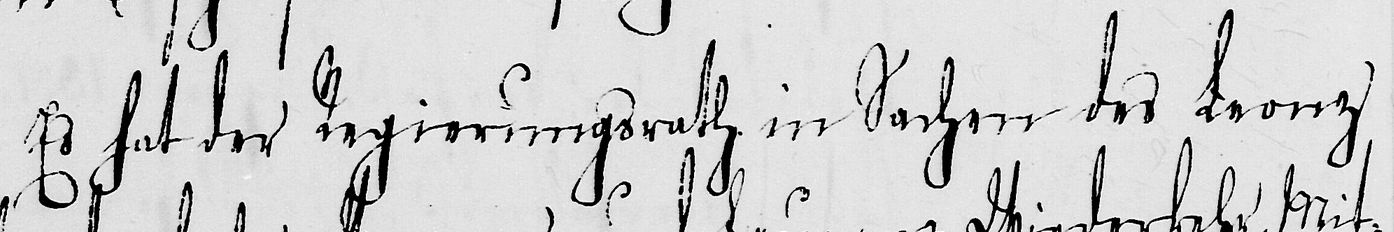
Es hat der Regierungsrath in Sachen des Franz
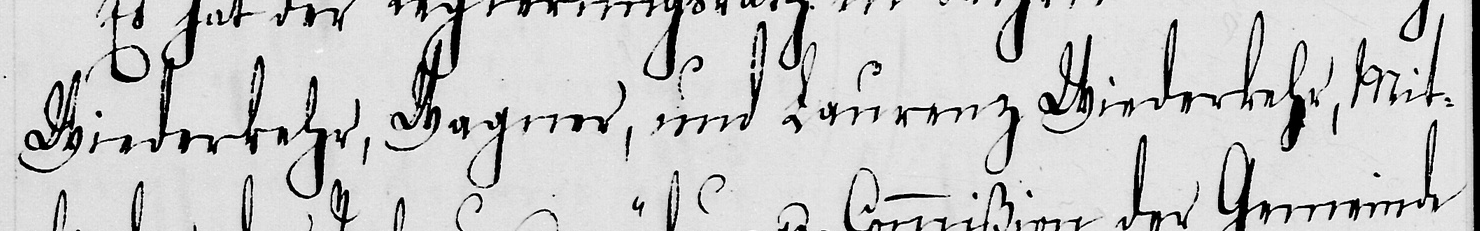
Wiederkehr, Wagner, und Laurenz Wiederkehr, Mit¬
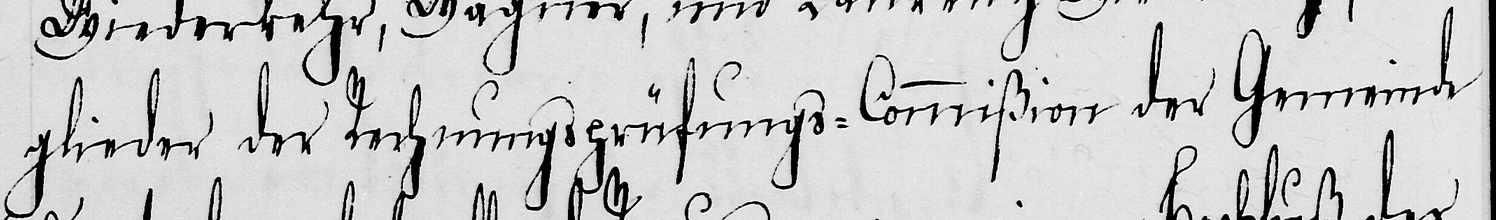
glieder der Rechnungsprüfungs-Commißion der Gemeinde
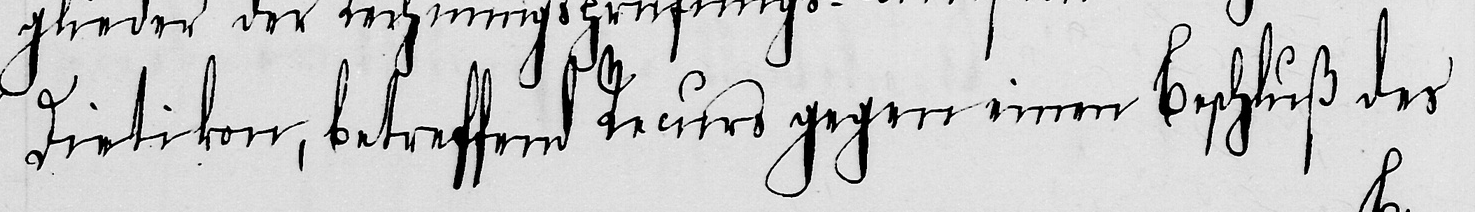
Dietikon, betreffend Recurs gegen einen Beschluß des
